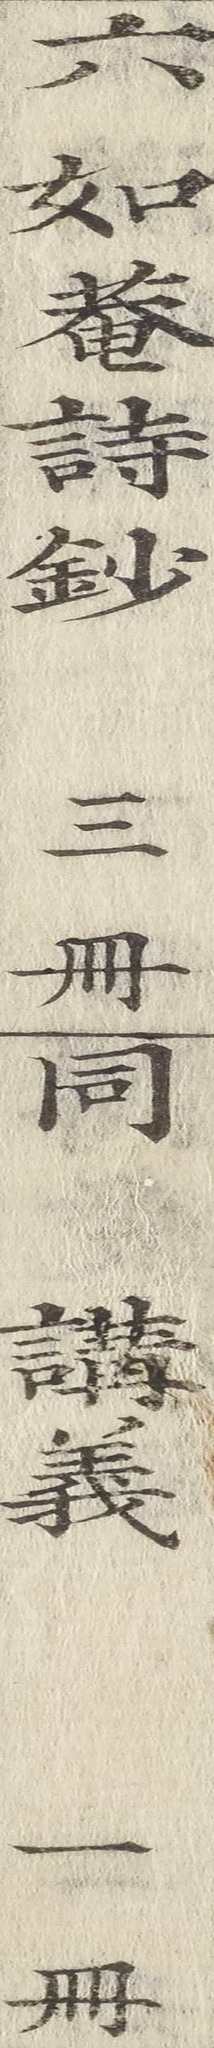六如菴詩鈔三冊同講義一冊
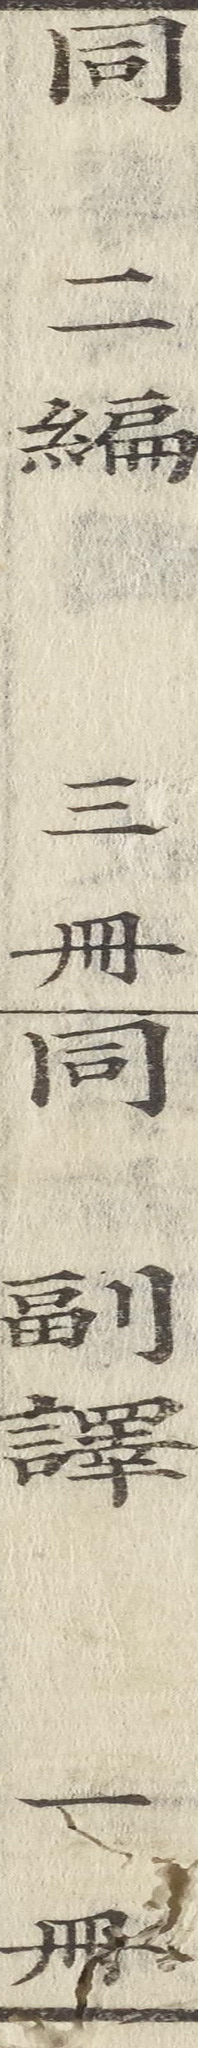同二編三冊同副訳一冊
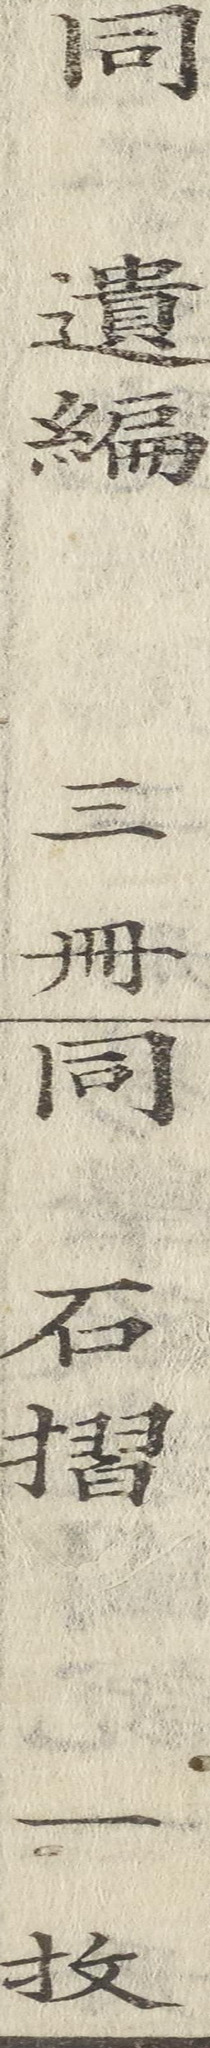同遺編三冊同石摺一枚
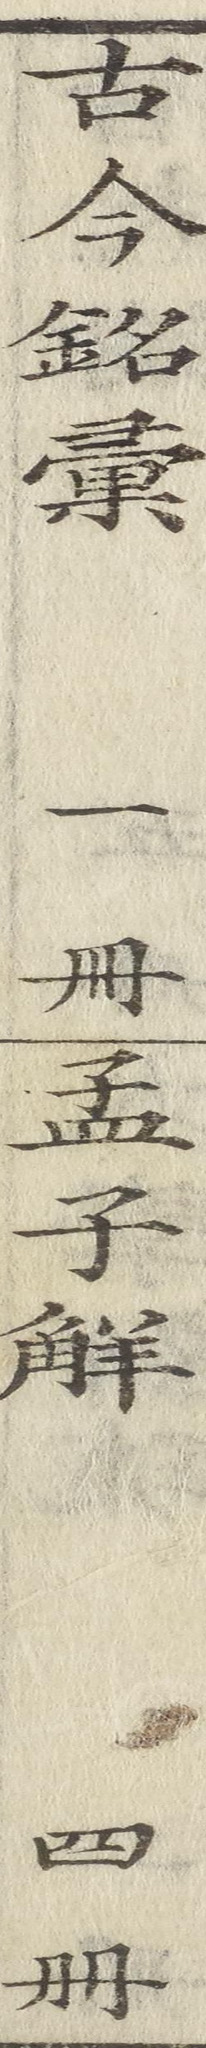古人銘彙一冊孟子解四冊
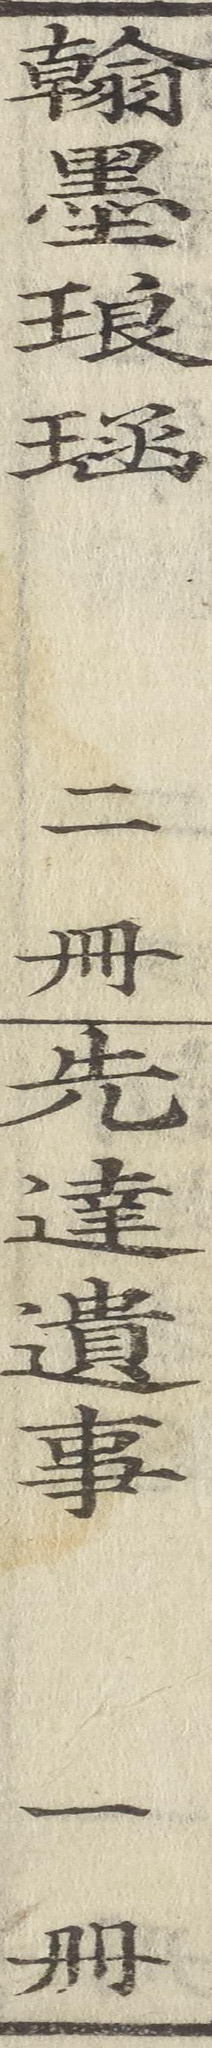翰墨琅函？二冊先達遺事一冊

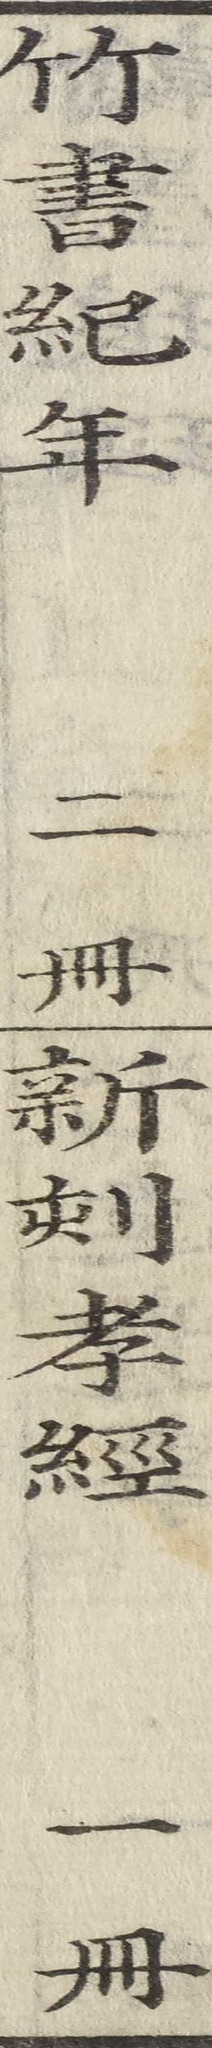竹書紀年二冊新刻孝経一冊
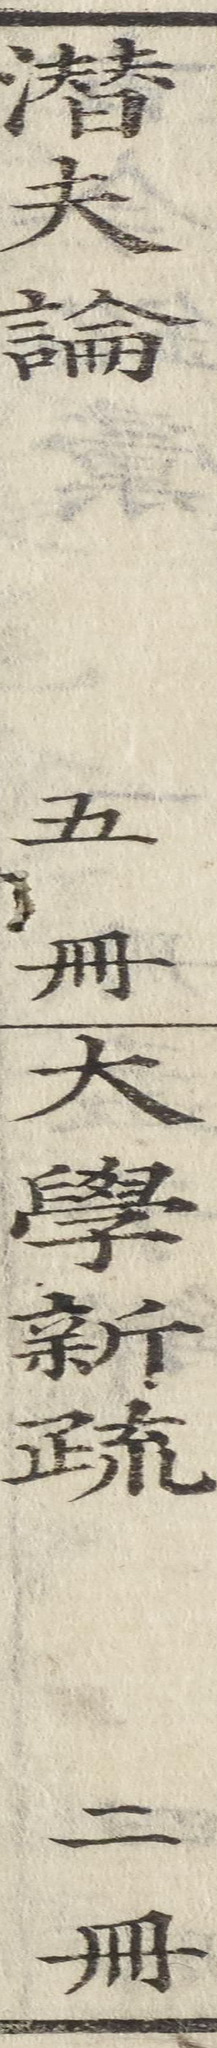潜夫論五冊大学新蔬二冊
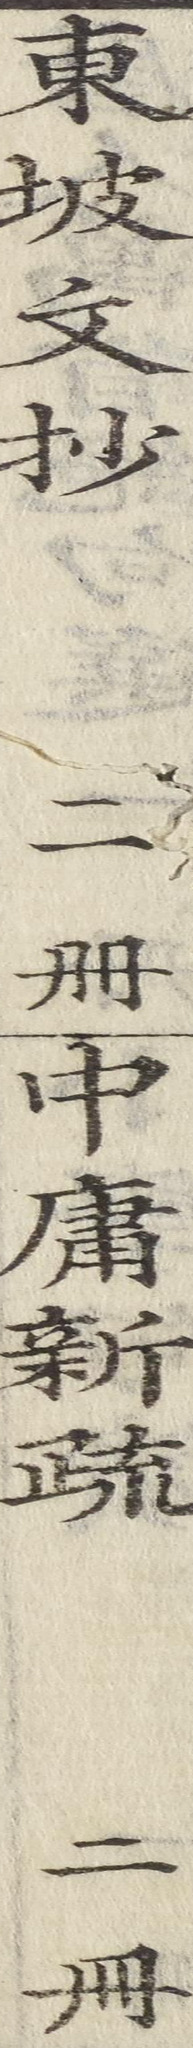東坡文抄二冊中庸新蔬二冊
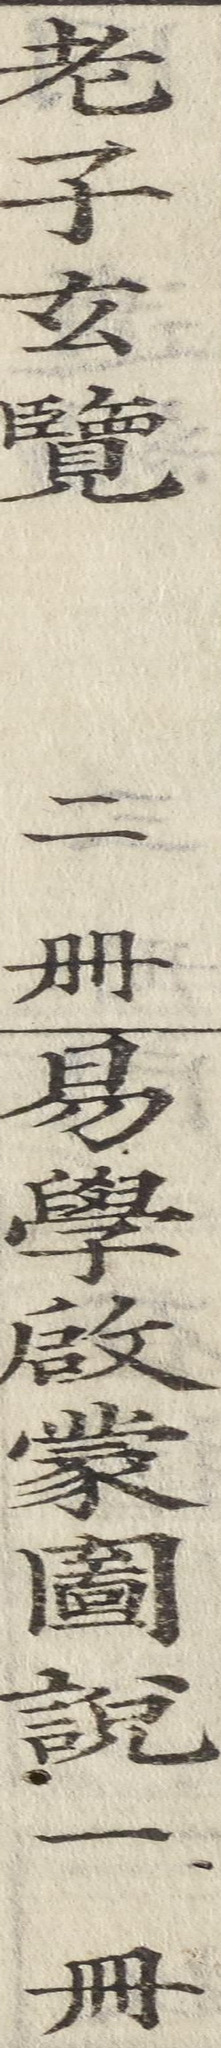老子玄覧二冊易学啓蒙図説一冊
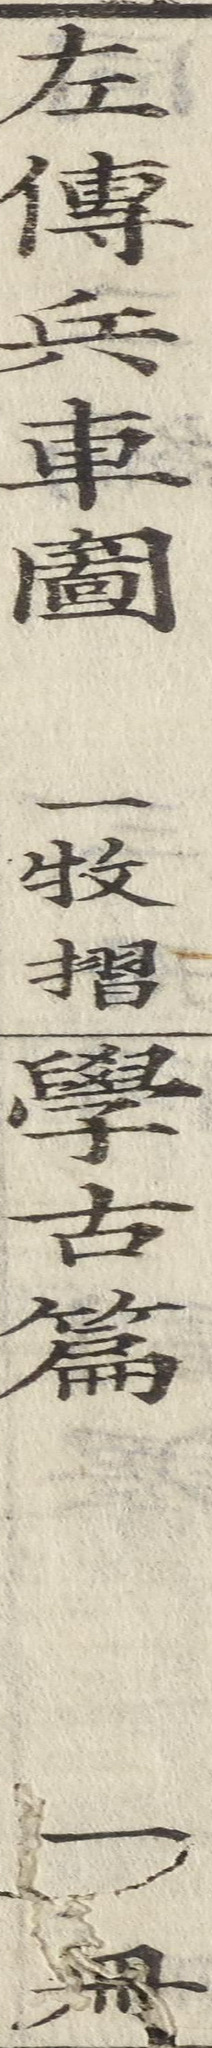左伝兵車図一牧摺学古篇一冊
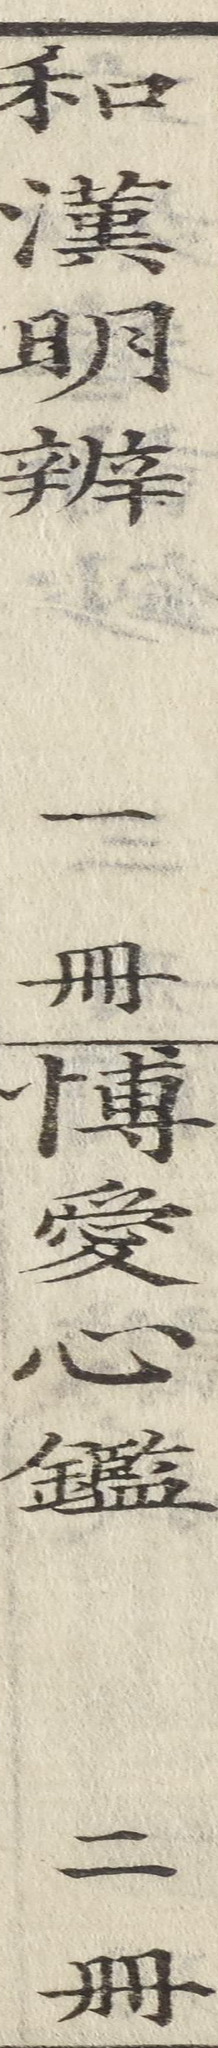和漢明辨一冊博愛心鑑二冊
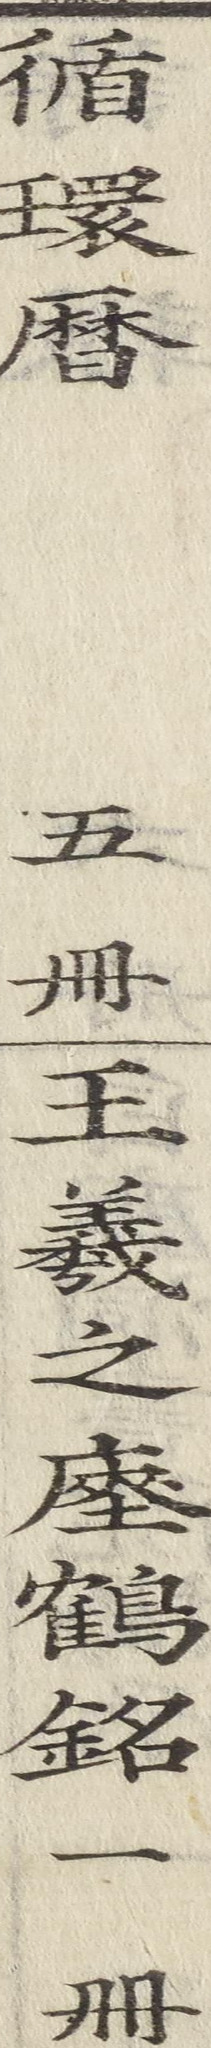循環暦五冊王羲之瘞鶴銘一冊
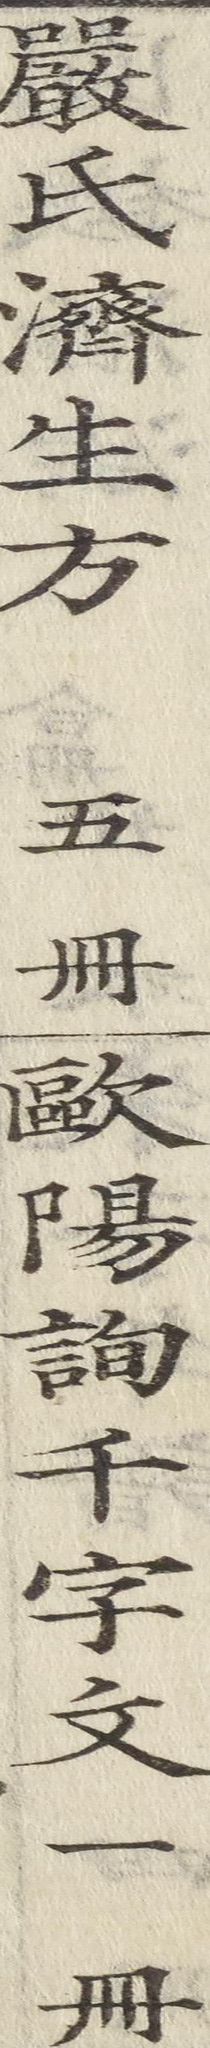厳氏済生方五冊欧陽詢千字文一冊
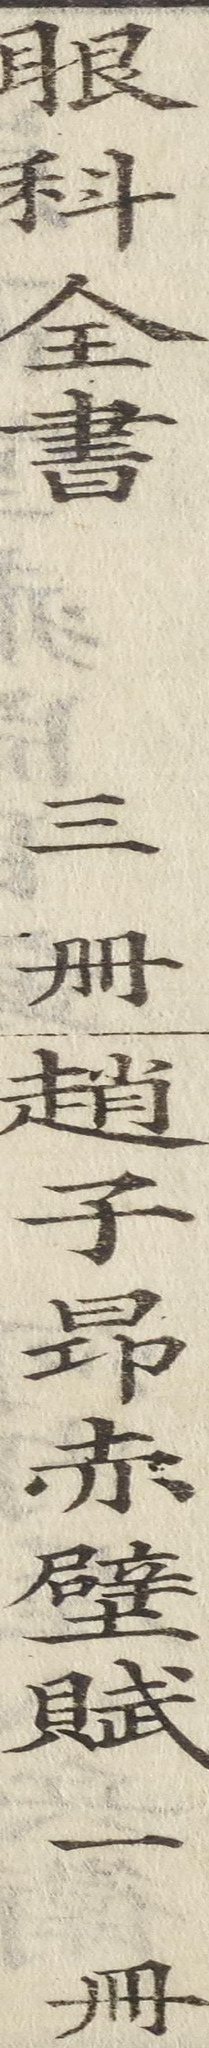眼科全書三冊趙子昂赤壁賦一冊
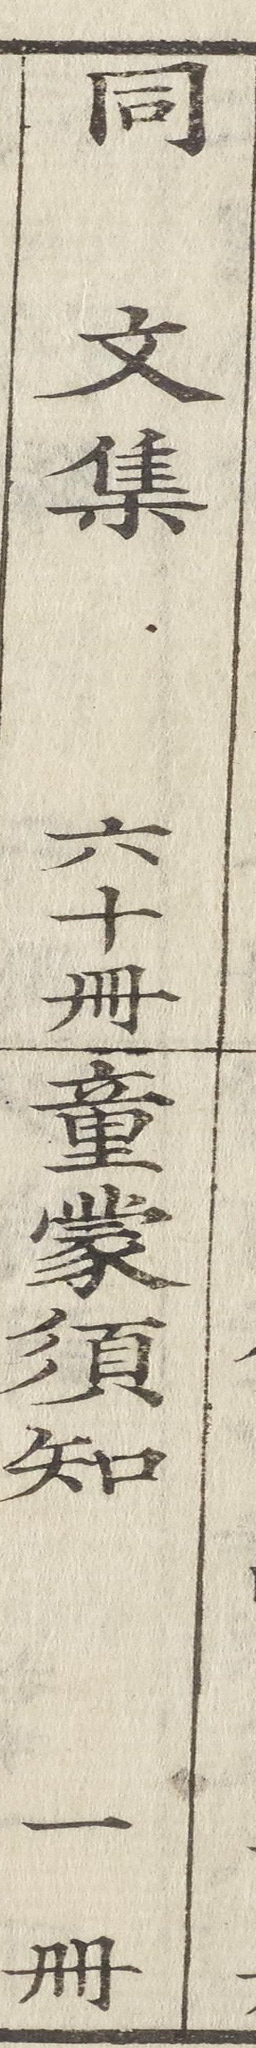同文集六十冊童蒙須知一冊
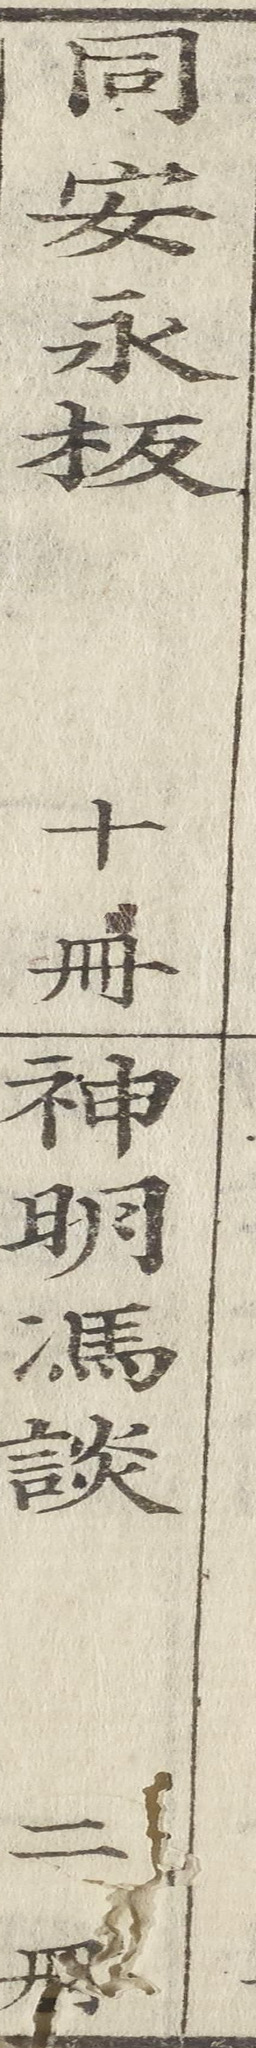同安永板十冊神明馮談二冊
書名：天經或問　地
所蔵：東京大学地震研究所図書室 Earthquake Research Institute Library, The University of Tokyo, JAPAN
